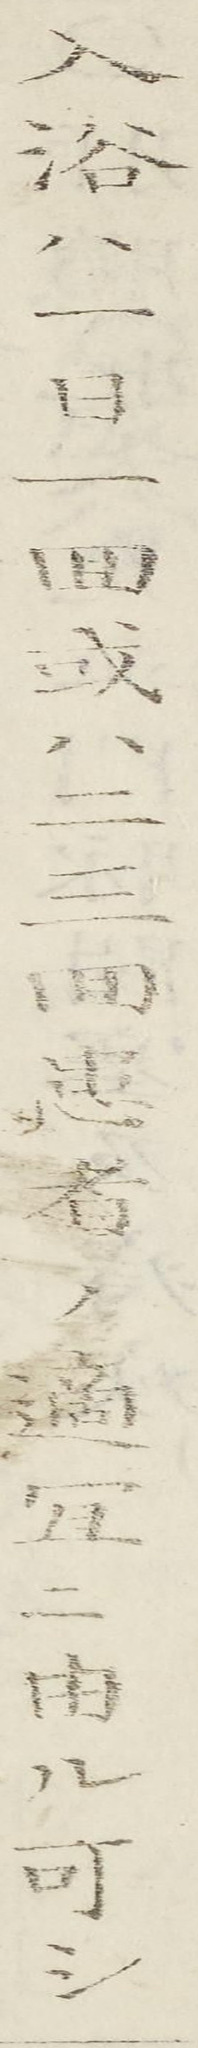入浴ハ一日一回或ハ二三回患者ノ適宜ニ由ル可シ
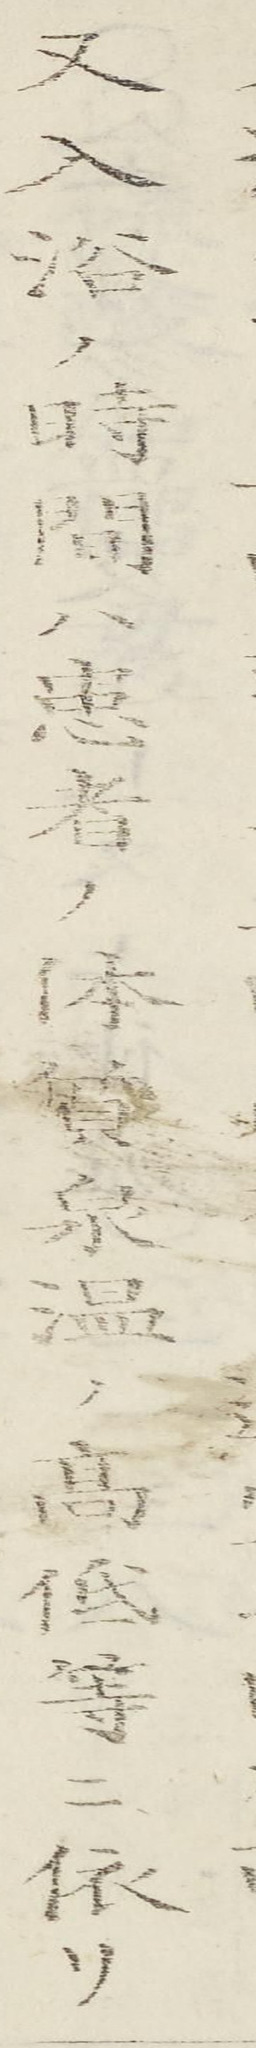又入浴ノ時間ハ患者ノ体質泉温ノ高低等ニ依リ
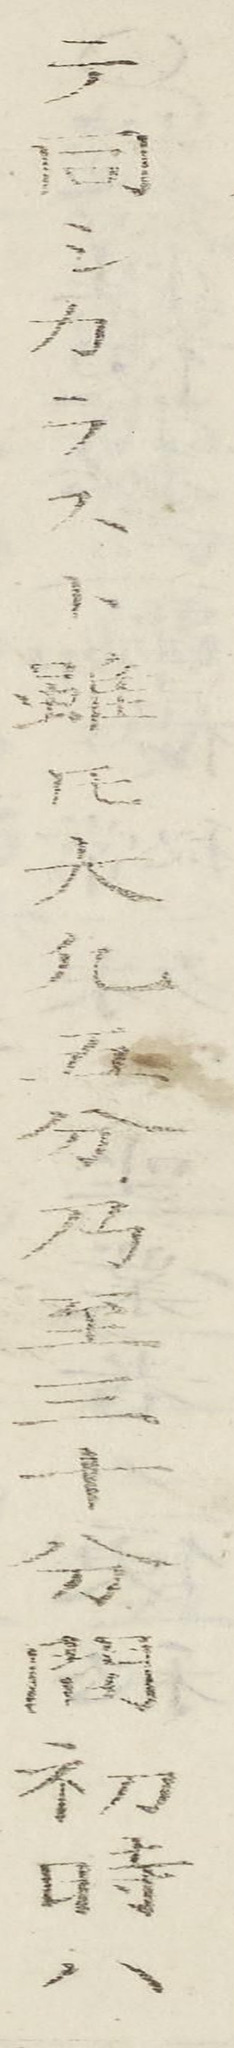テ同シカラスト雖トモ大凡五分乃至三十分間初時ハ
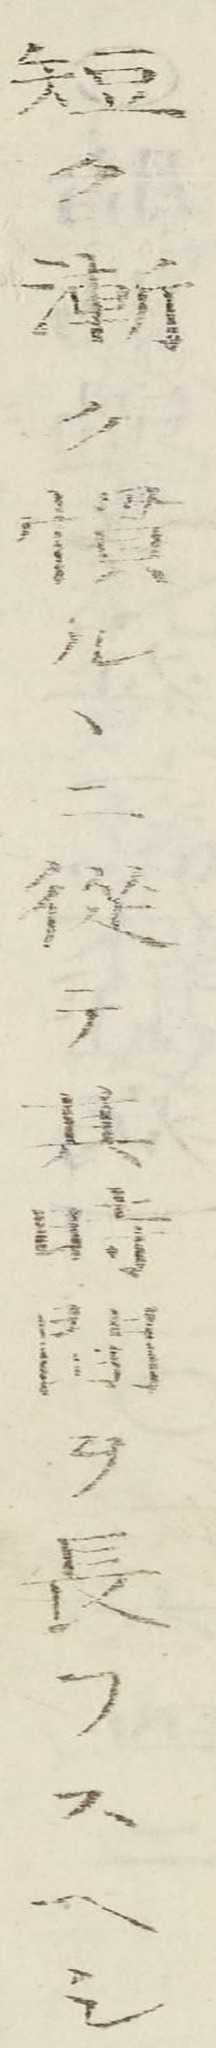短ク漸ク慣ルヽニ従テ其時間ヲ長フスヘシ
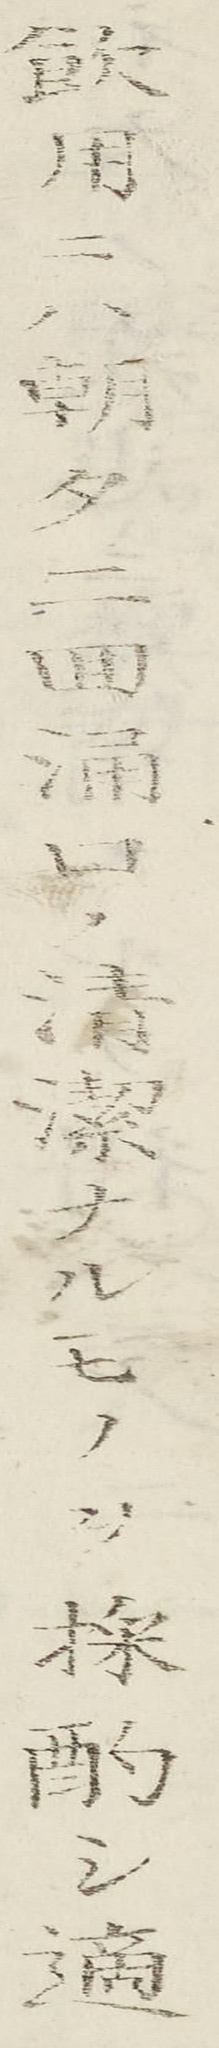飲用ニハ朝夕二回涌口ノ清潔ナルモノヲ採酌シ適
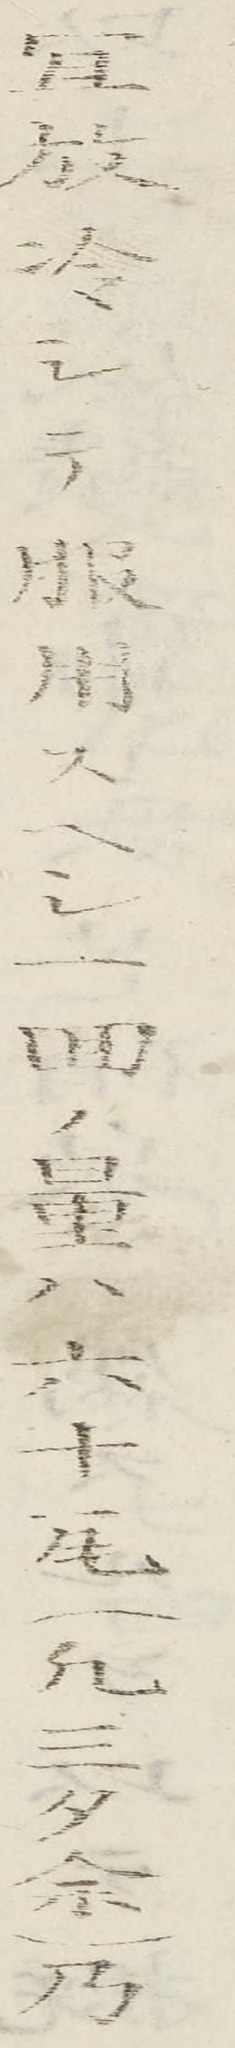宜放冷シテ服用スヘシ一回ノ量ハ六十瓦乃
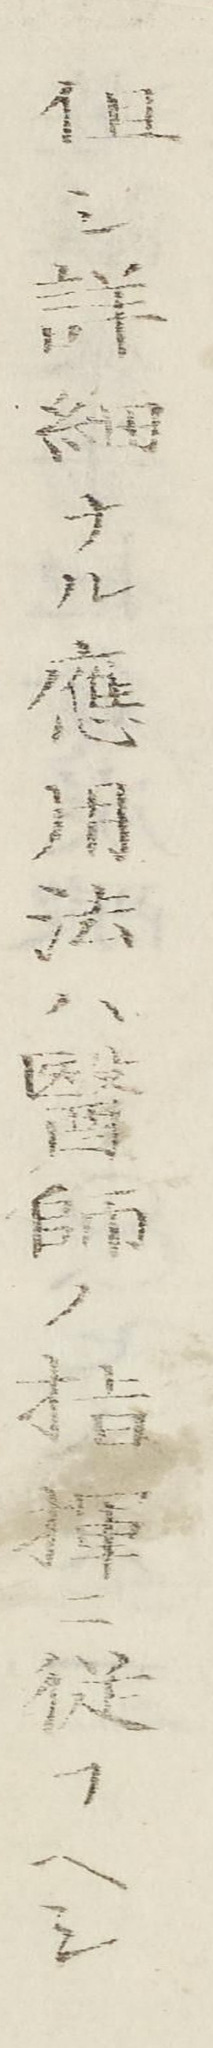但シ詳細ナル応用法ハ医師ノ指揮ニ従フヘシ
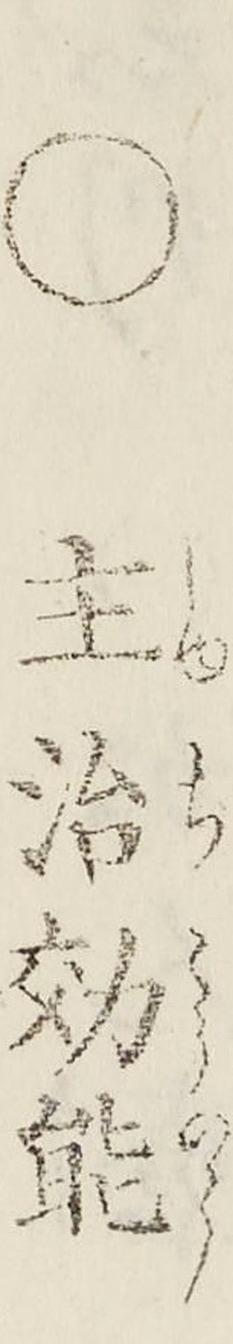〇主治効能
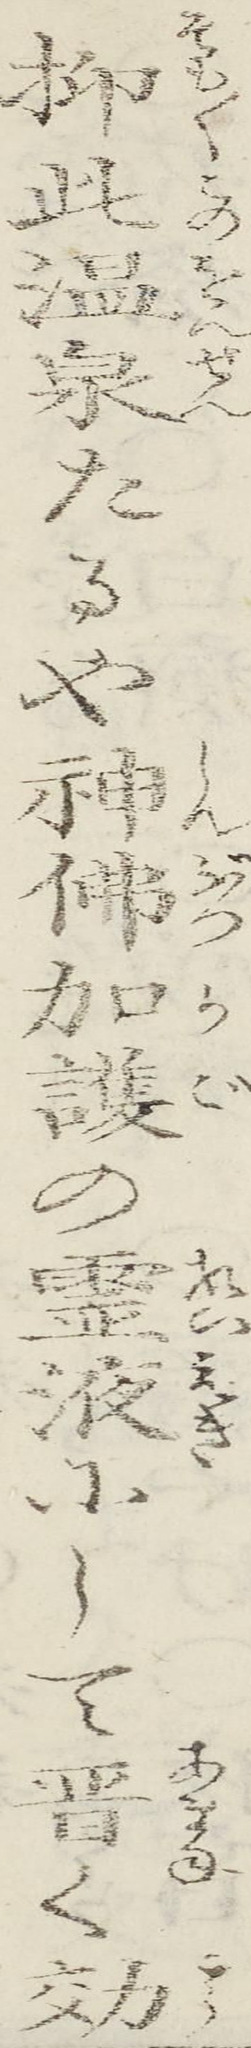抑々此温泉たるや神仏加護の霊液にして普く効
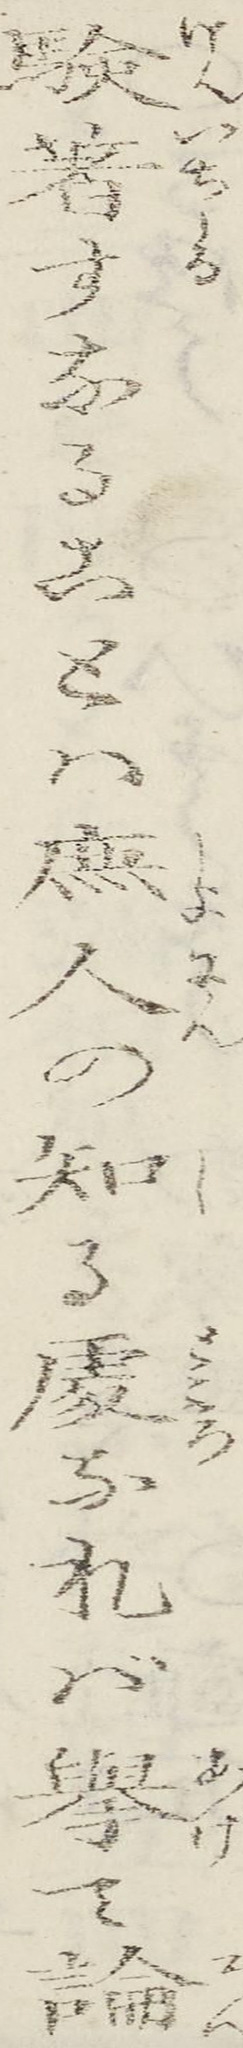験著すなることは庶人の知る処なれば挙て論
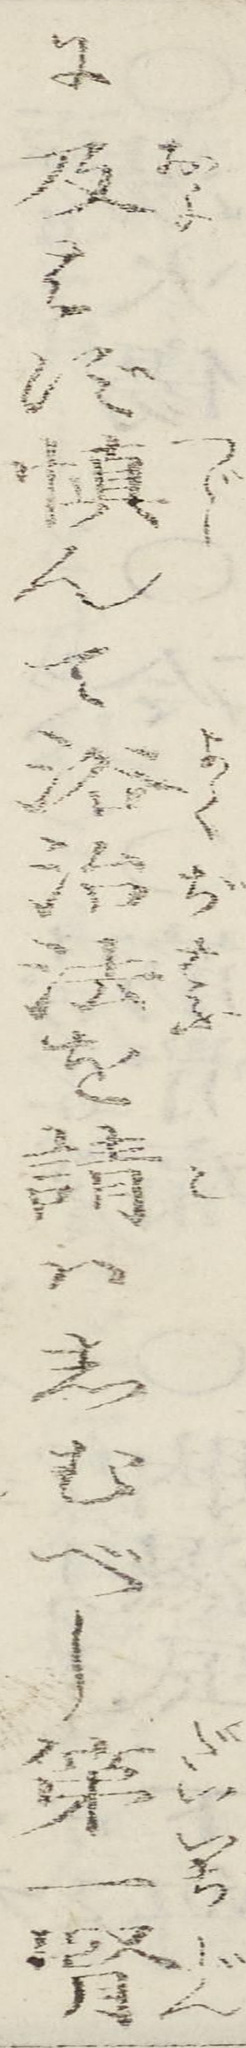に及はず慎んて浴治法を請はしむべし第一腎
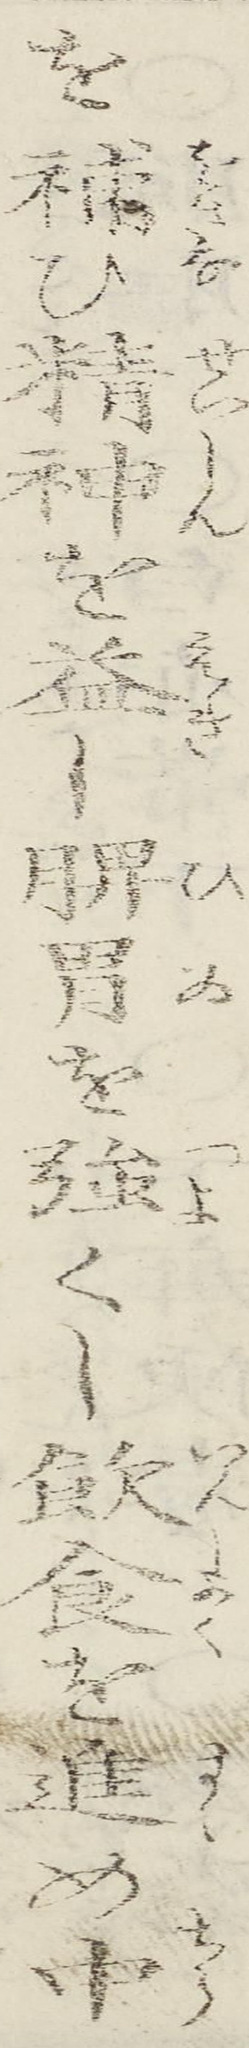を補ひ精神を益し脾胃を強くし飲食を進め中
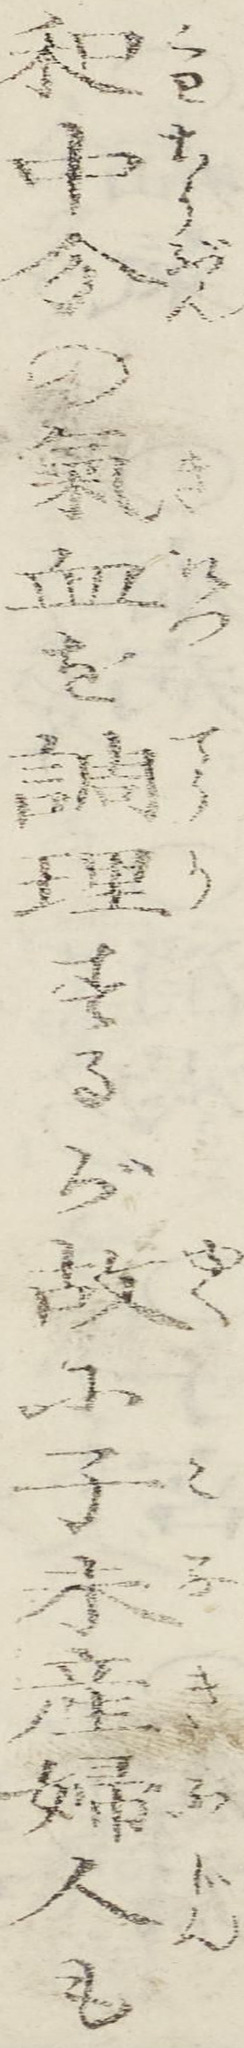和中分の気血を調理するが故に子未産婦人も
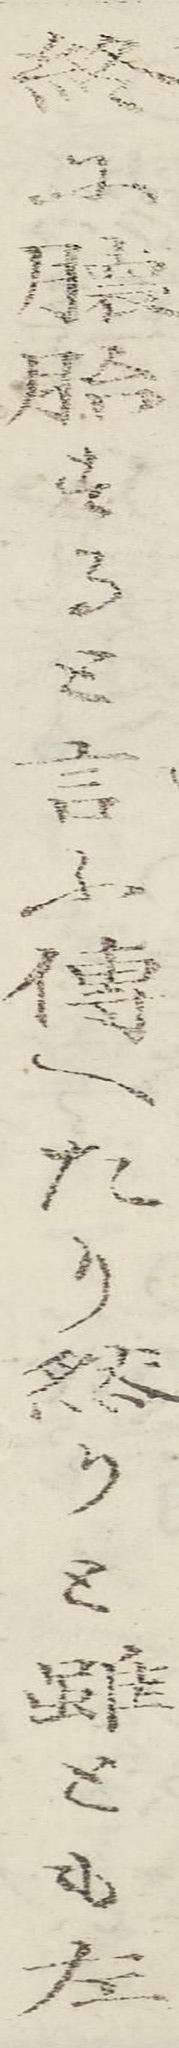終に懐胎すると言ふ伝へたり然りと雖とも左
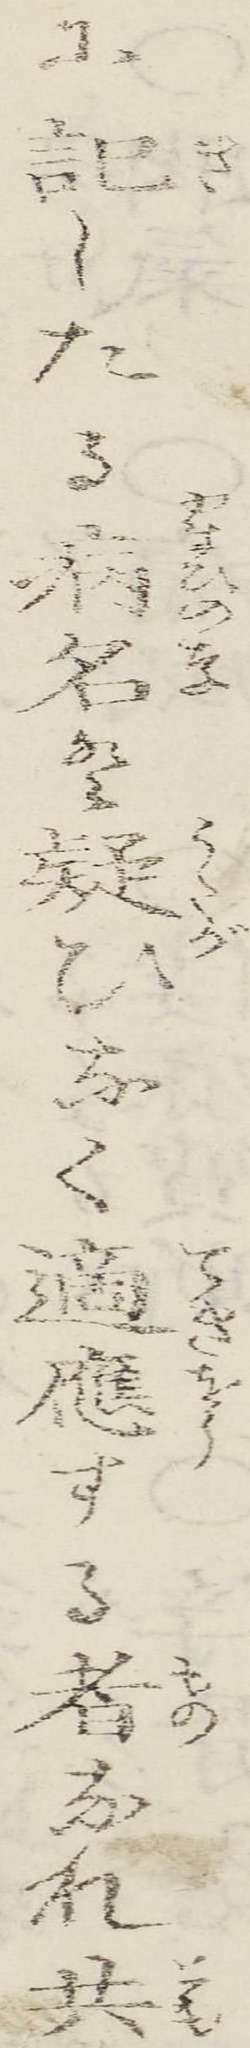に記したる病名を疑ひなく適応する者なれ共
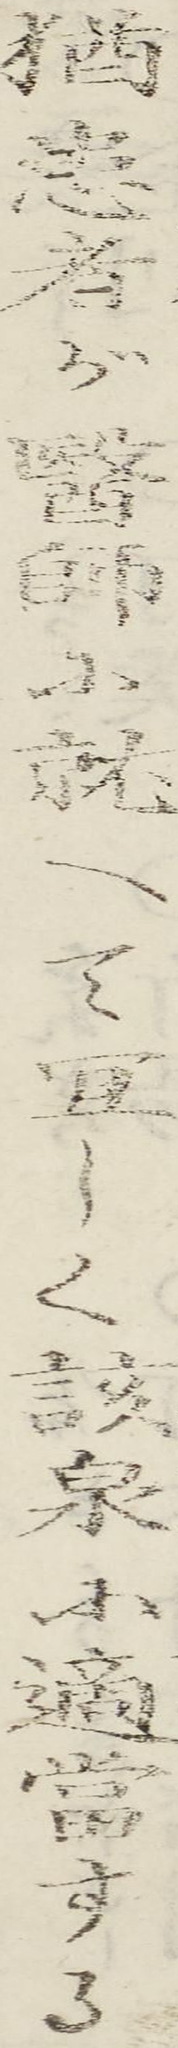猶患者が医師に就へて宜しく該泉に適当する
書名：鎌先温泉由來記
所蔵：東京大学地震研究所図書室 Earthquake Research Institute Library, The University of Tokyo, JAPAN
